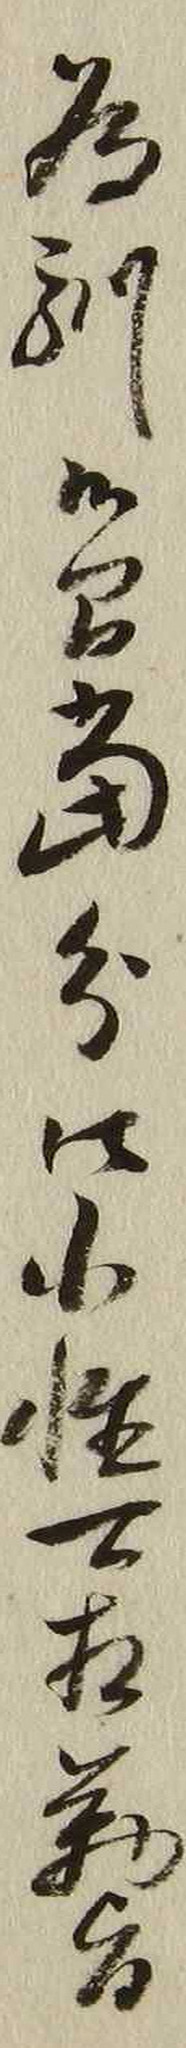為馴候間当分御小性可相勤旨
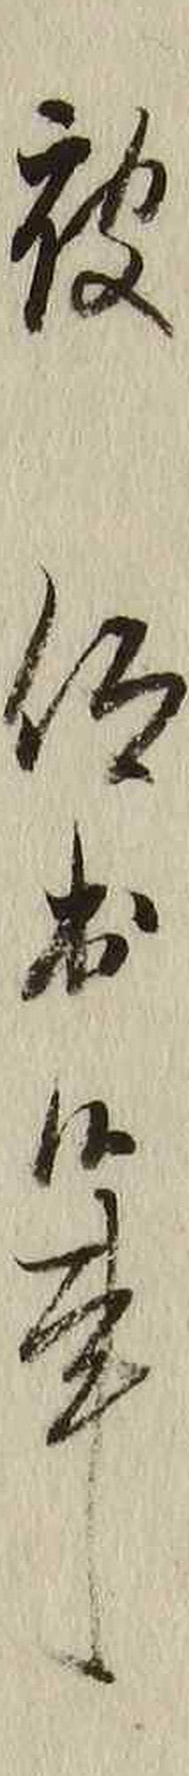被仰出候事
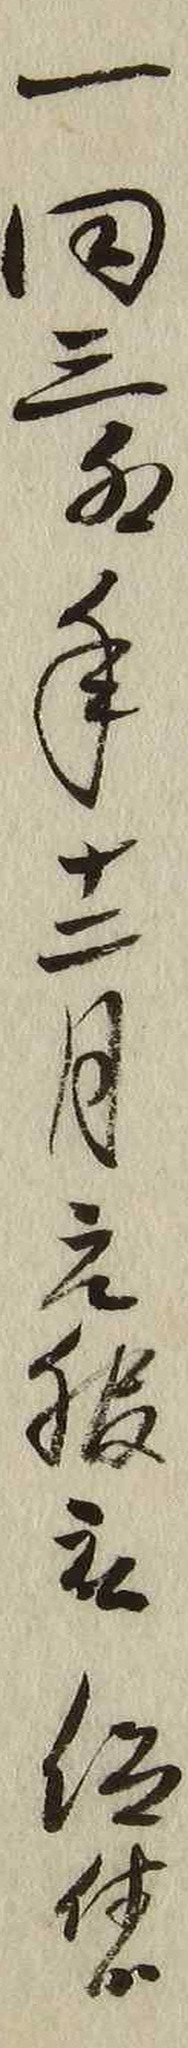一同三卯年十二月元服被仰付候
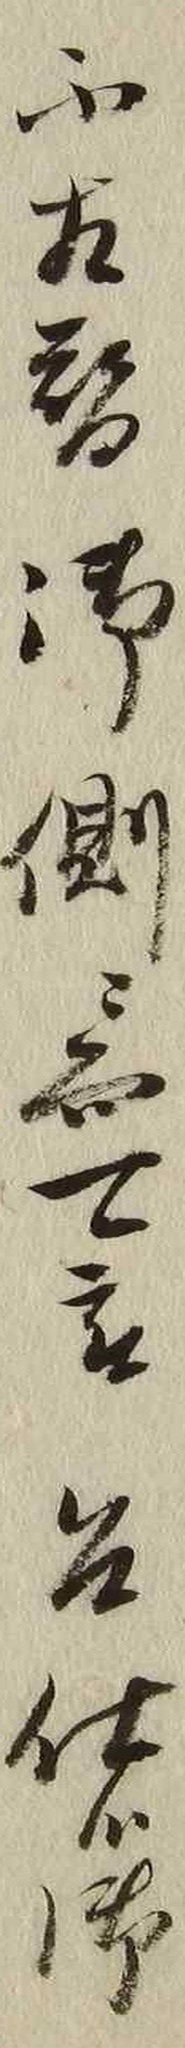不相替御側ニ而可被召仕候御
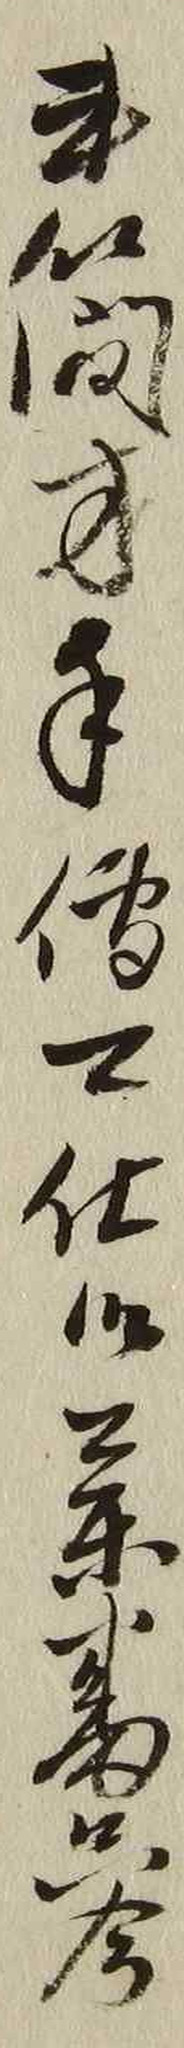書簡方手伝可仕候薬番只今
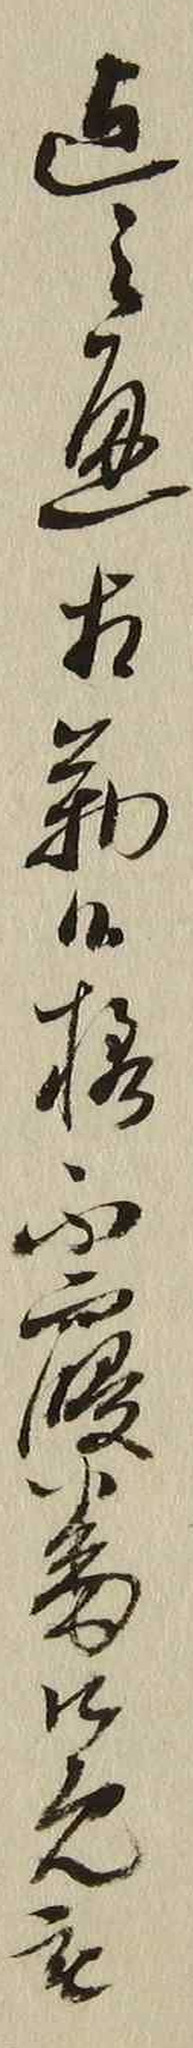迄之通相勤候様不覆番御免被
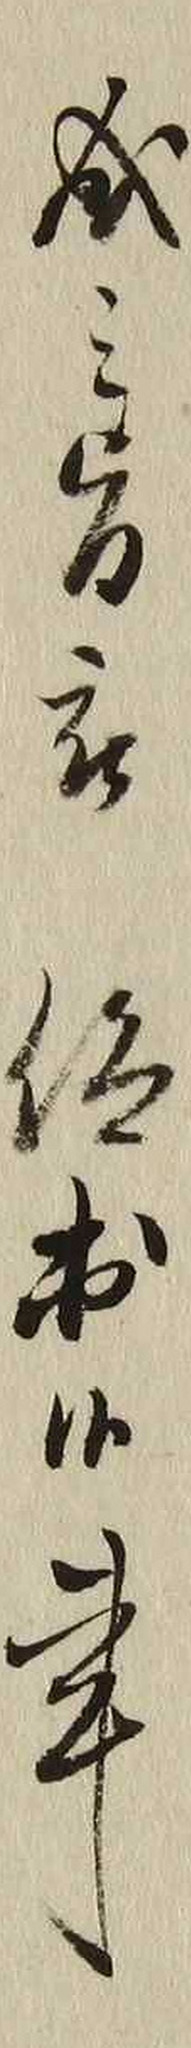成之旨被仰出候事
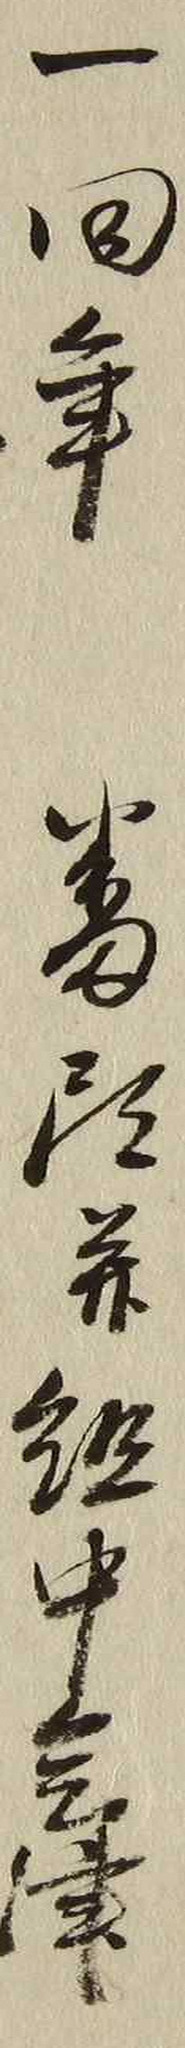一同年番頭并組中会津
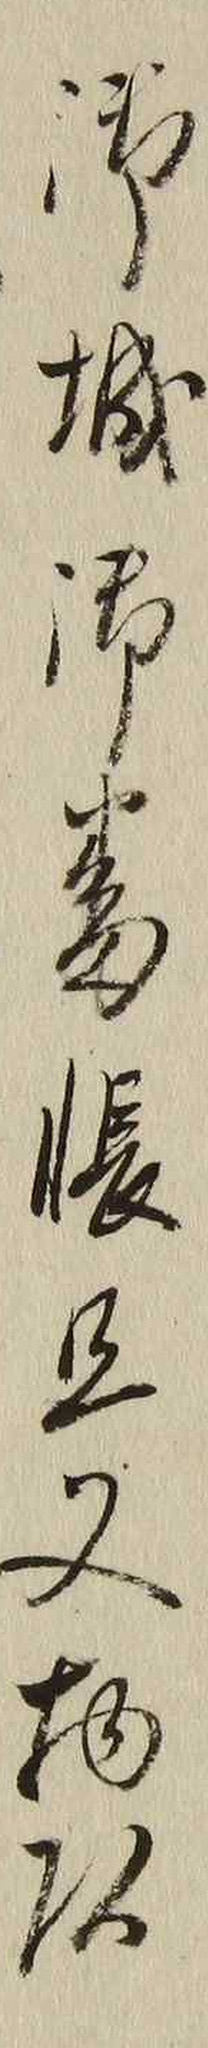御城御番帳且又物頭
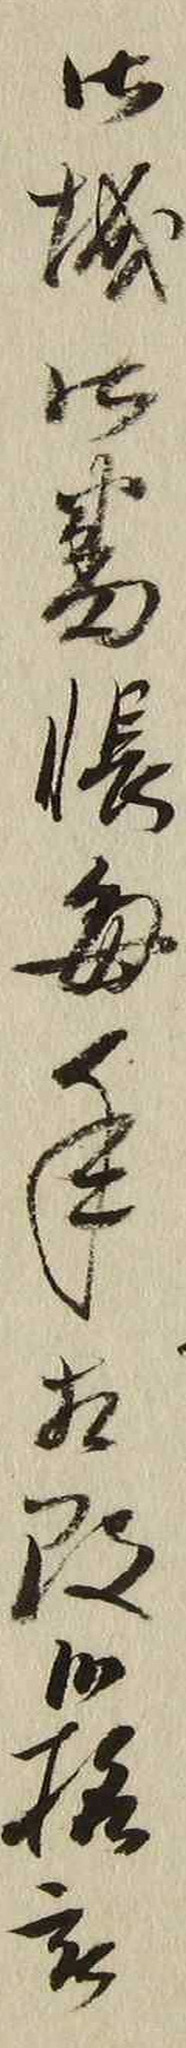御城御番帳毎年相改候様被
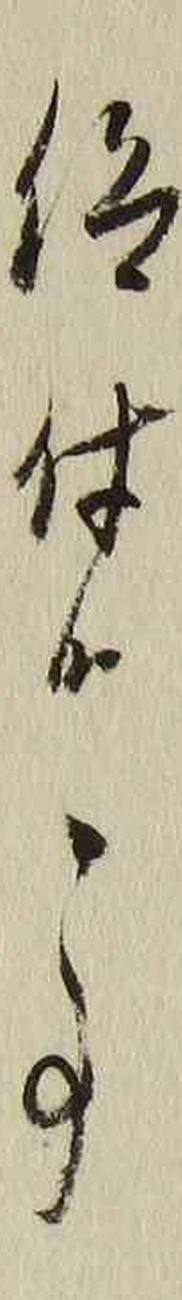仰付候事
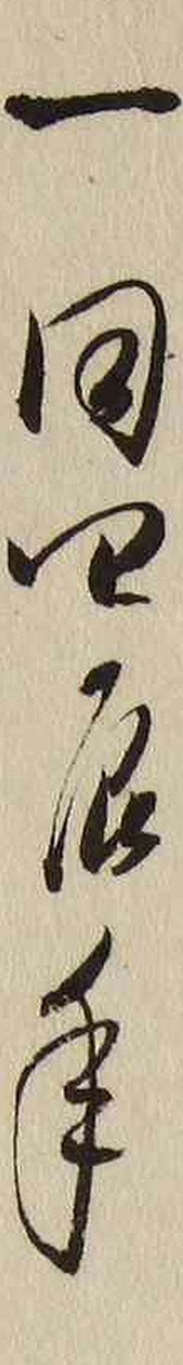一同四辰年
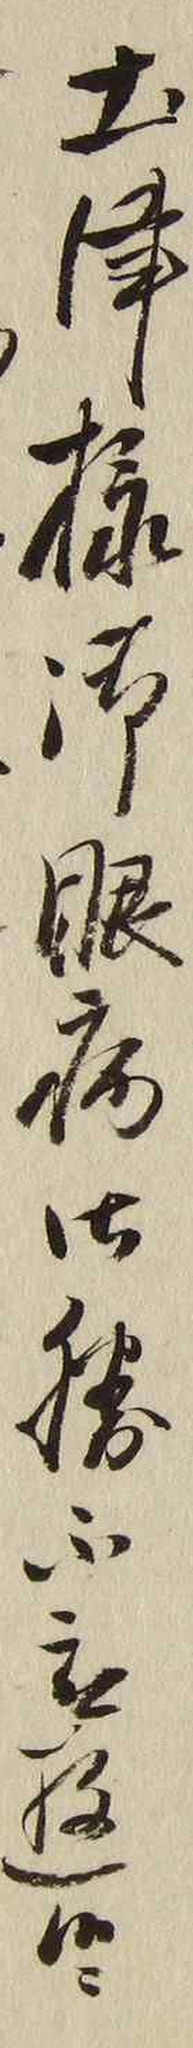土津様御眼病御勝不被遊候ニ
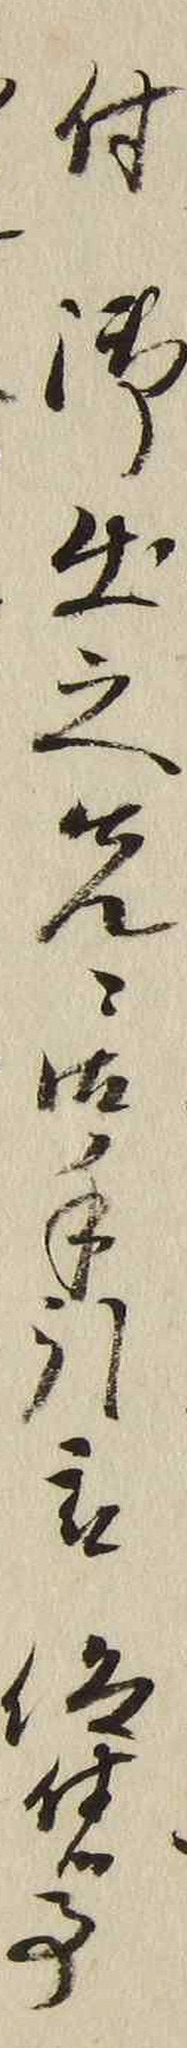付御出之先々御手引被仰付候事
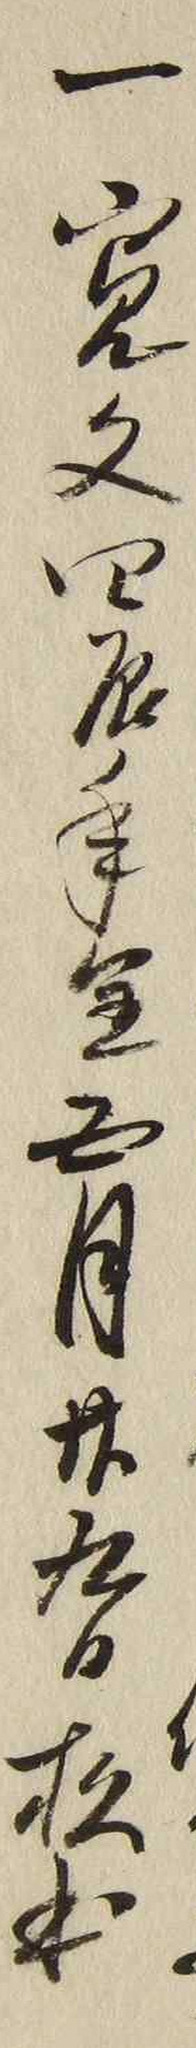一寛文四辰年閏五月廿九日杉本

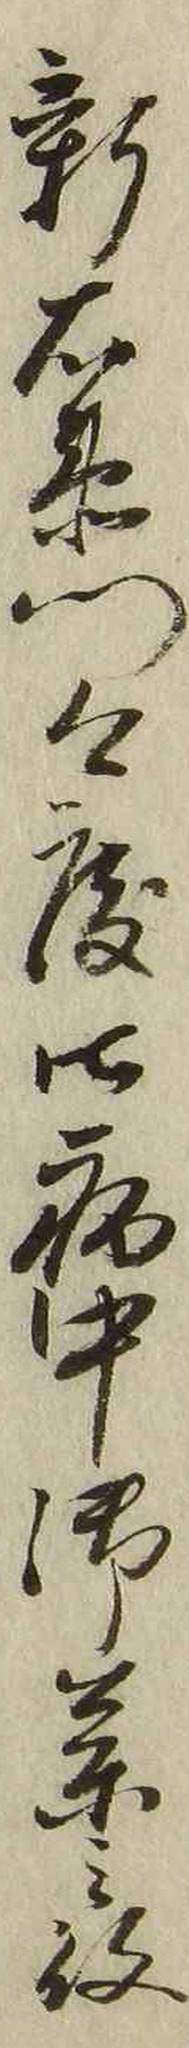新右衛門今度御病中御薬之役
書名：諸士系譜　巻之355　す之部5
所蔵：会津若松市立会津図書館
